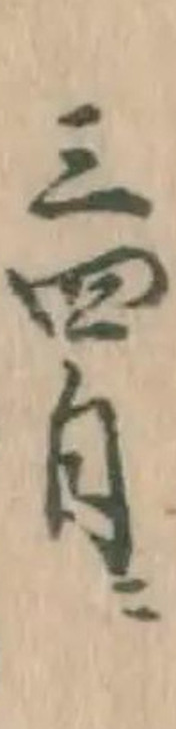三四月に
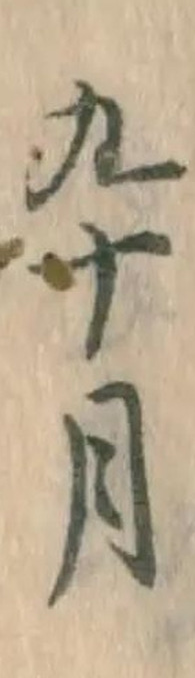九十月
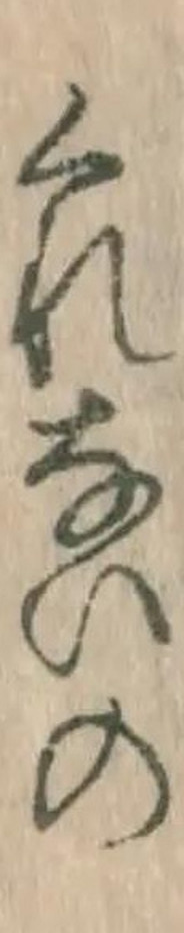くれないの
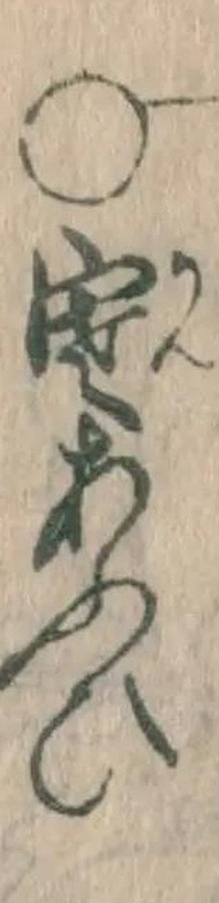〇寒あふひ
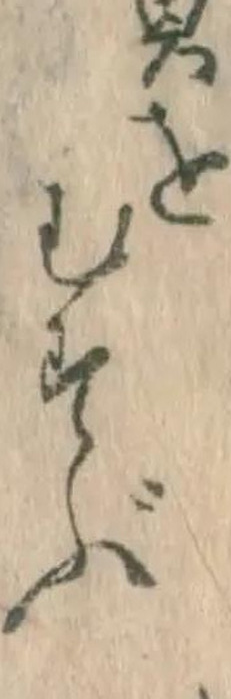むすぶ
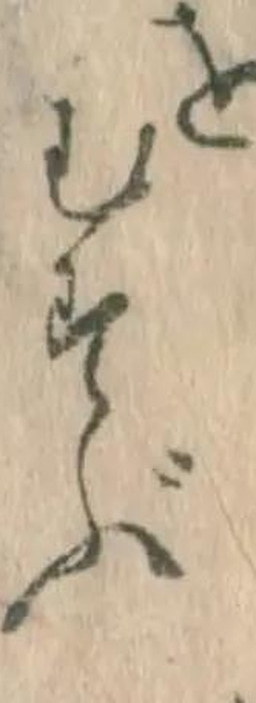むすぶ
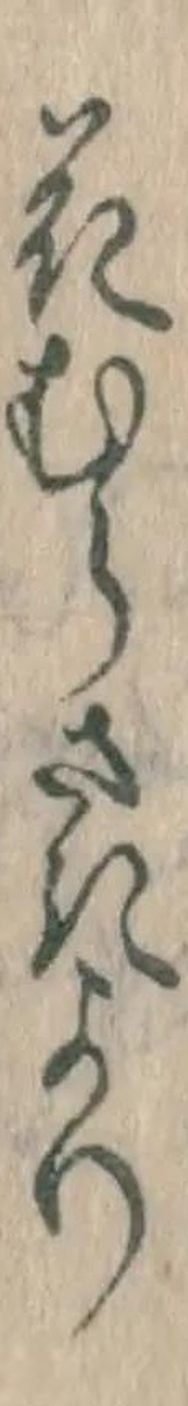花むらさきより
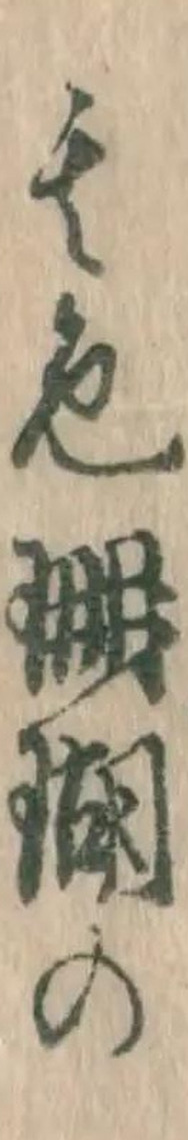其色珊瑚の
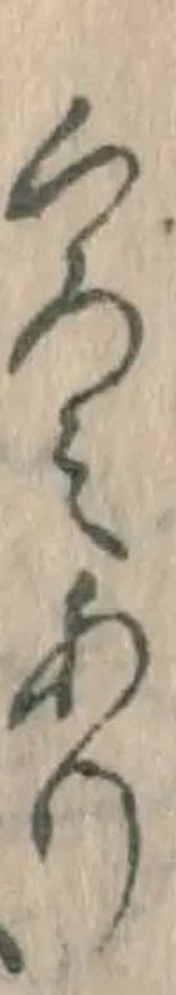くろみあり
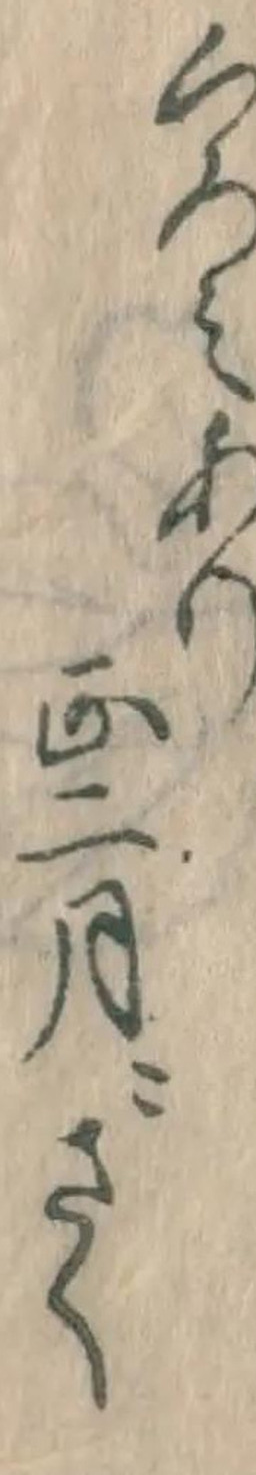正二月にさく
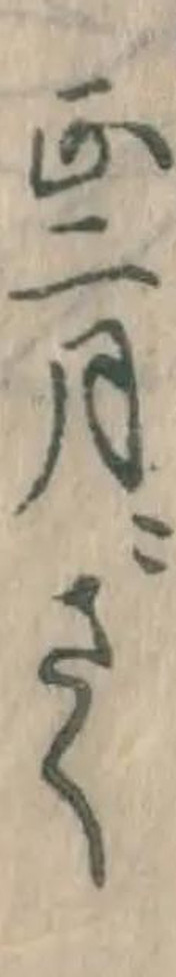正二月にさく
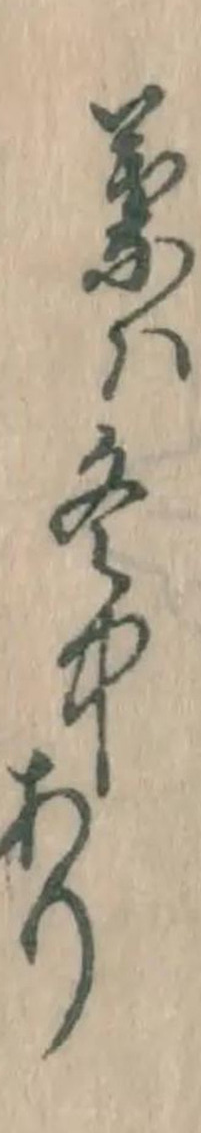葉は冬中あり

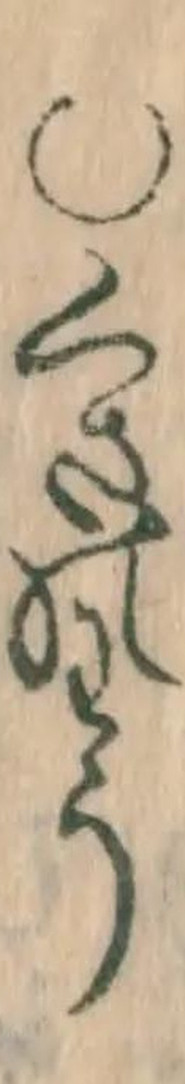〇くさのわう
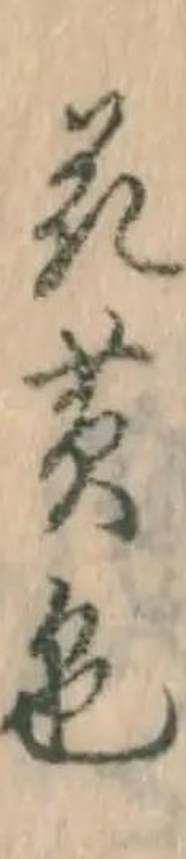花黄色
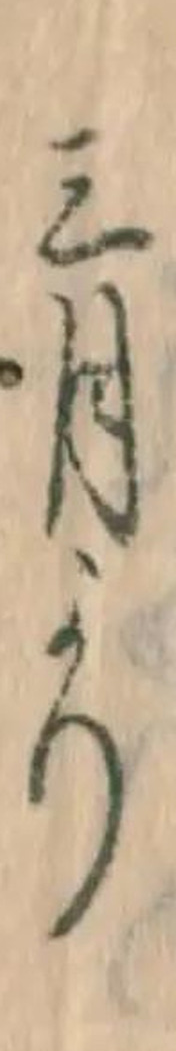三月より
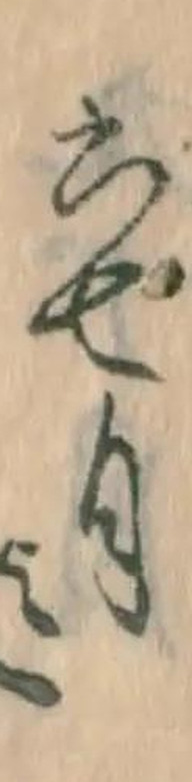六七月
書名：艸花繪前集. [2]
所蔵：国立国会図書館 National Diet Library, JAPAN
